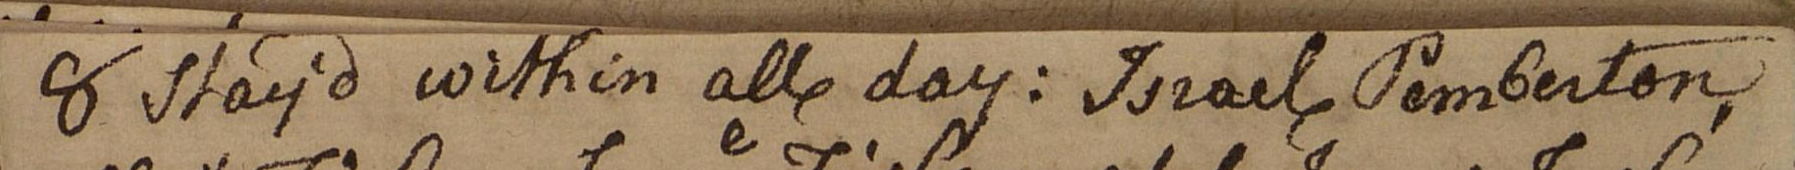8 Stay'd within all day: Israel Pemberton,
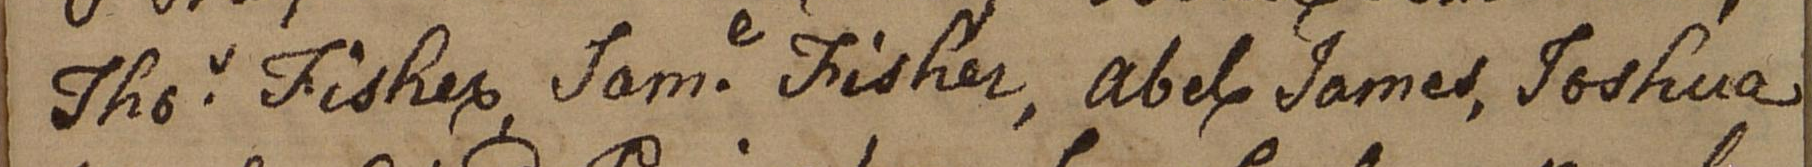Tho^s. Fisher Sam^l. Fisher, Abel James, Joshua
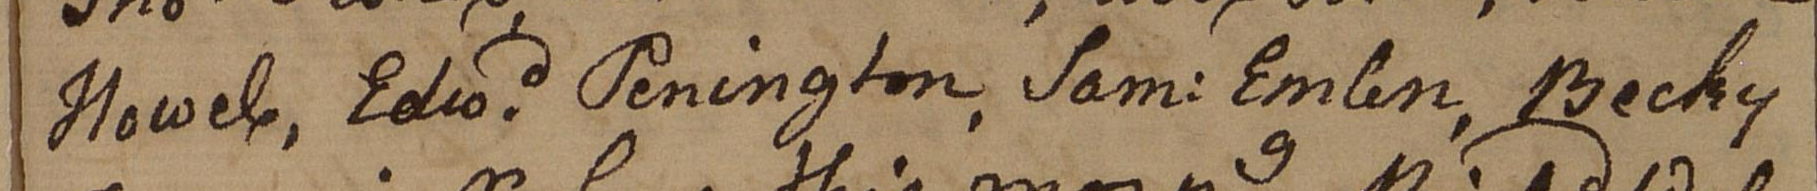Howel, Edw^d. Penington, Sam: Emlen, Becky
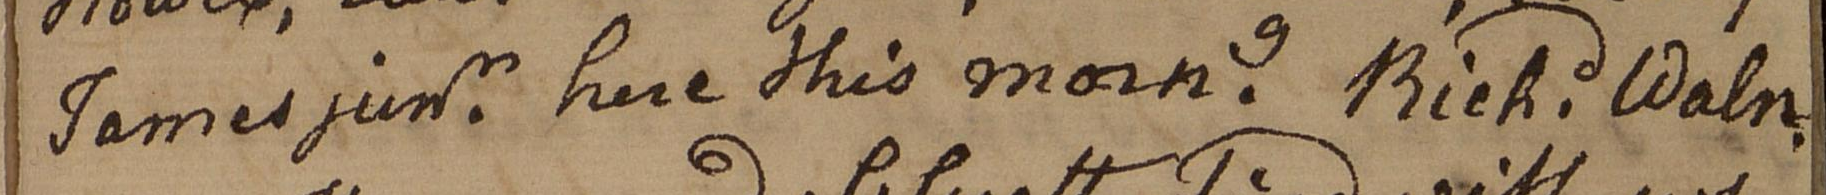James jun^r. here this morn^g. Rich^d: Waln,
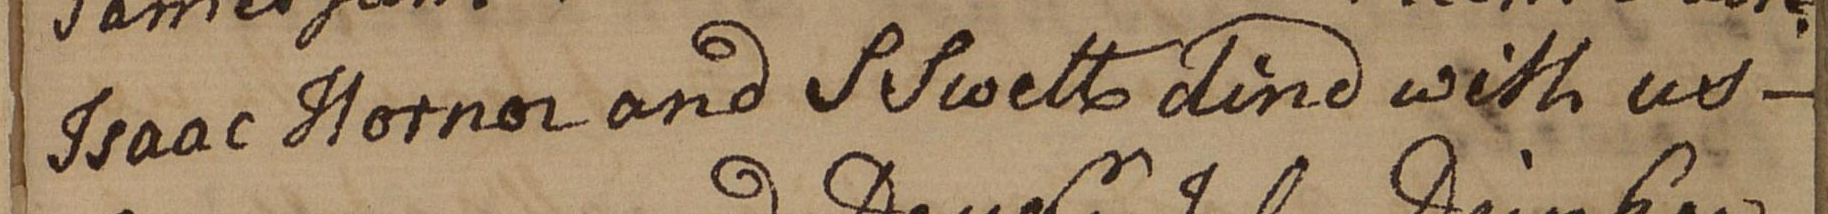Isaac Hornor and S Swett dind with us-
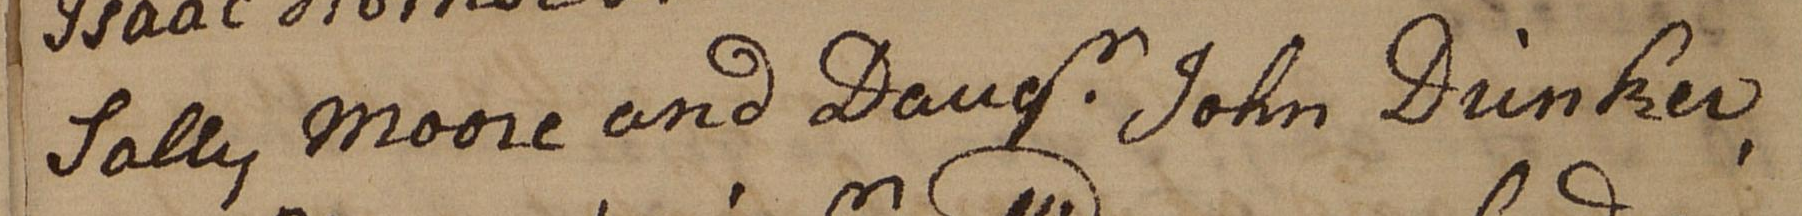Sally Moore and Daug^r. John Drinker,
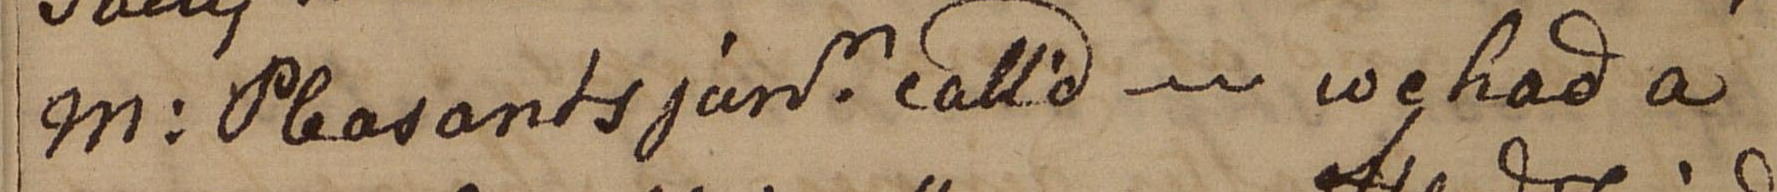M: Pleasants jun^r. call'd- we had a
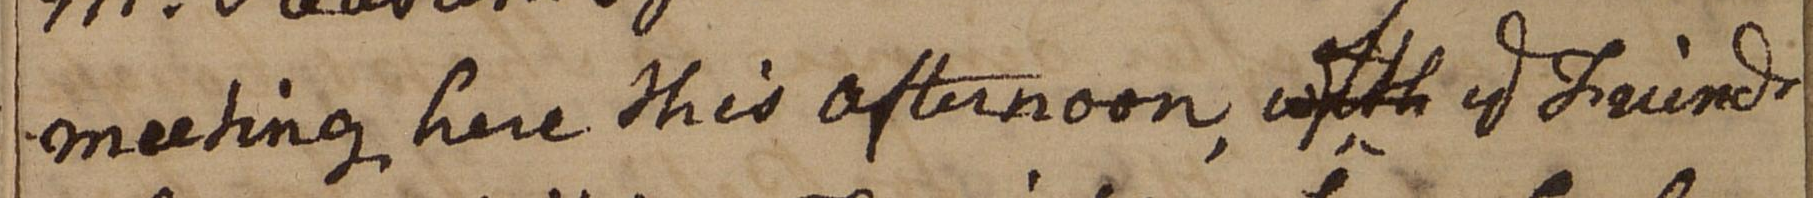meeting here this afternoon with y^e Friend
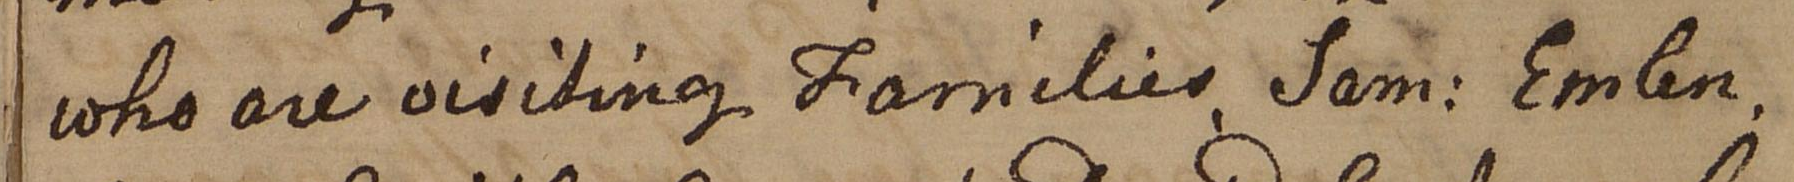who are visiting Families, Sam: Emlen,
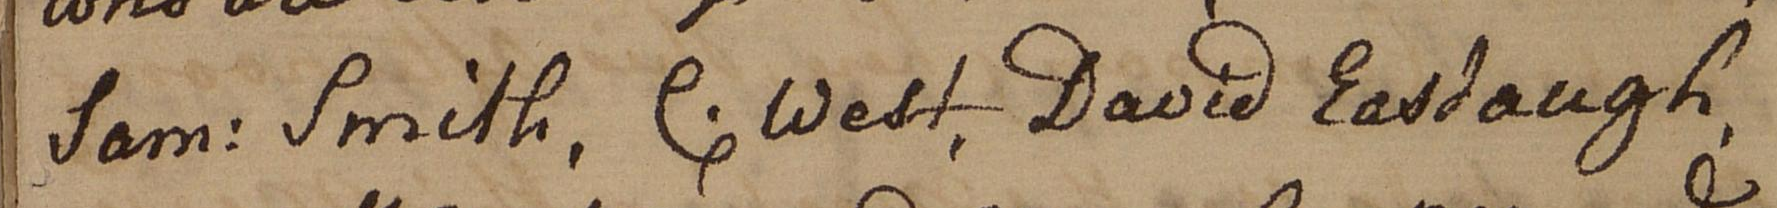Sam: Smith, C. West, David Easdaugh,
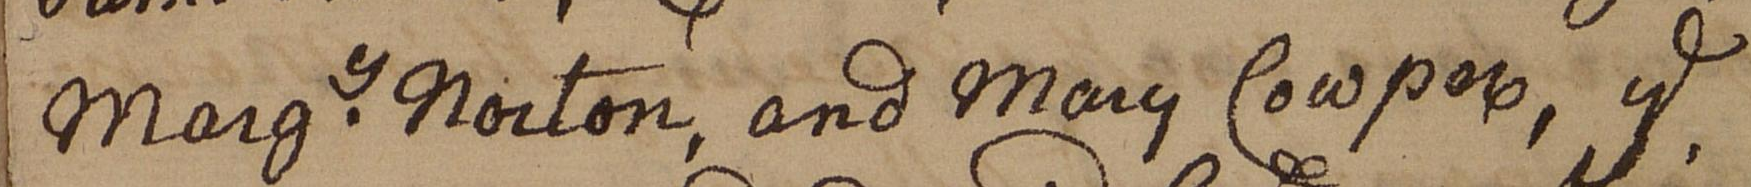Marg^y. Norton, and Mary Cowper, y^e
